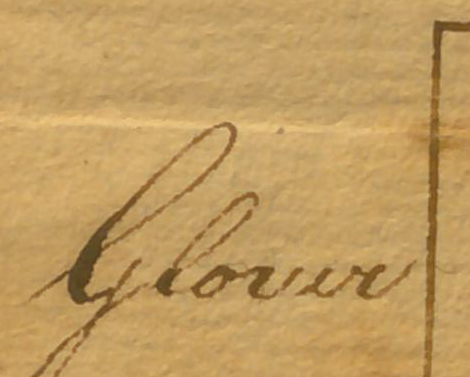Glover
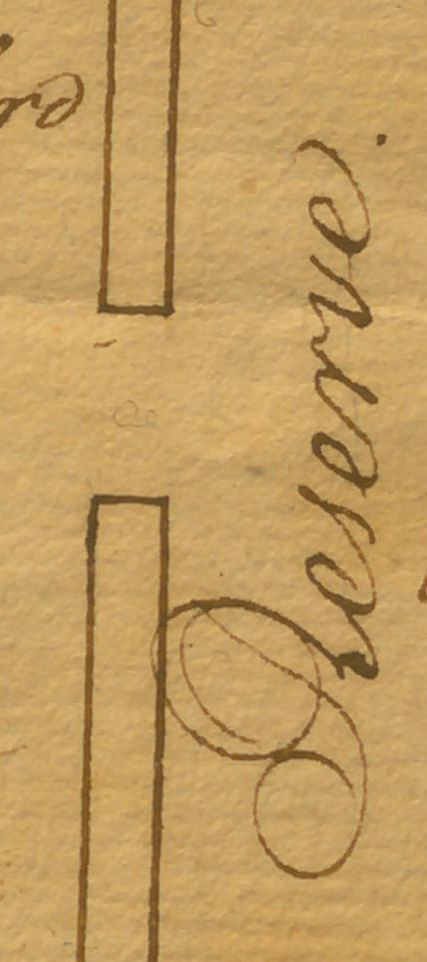Reserve.
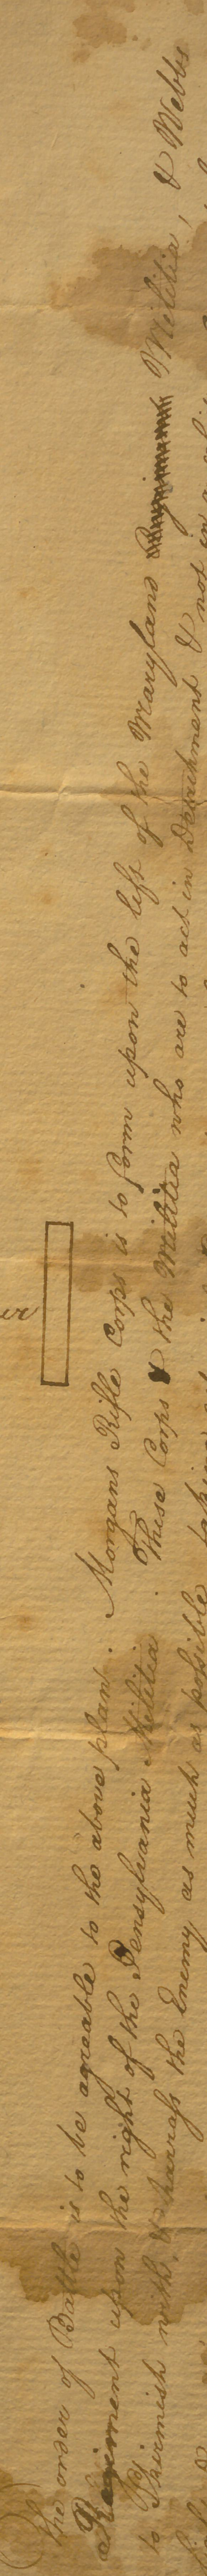The order of Battle is to be agreable to the above plan. Morgans Rifle Corps is to form upon the left of the Maryland Militia, & Webbs
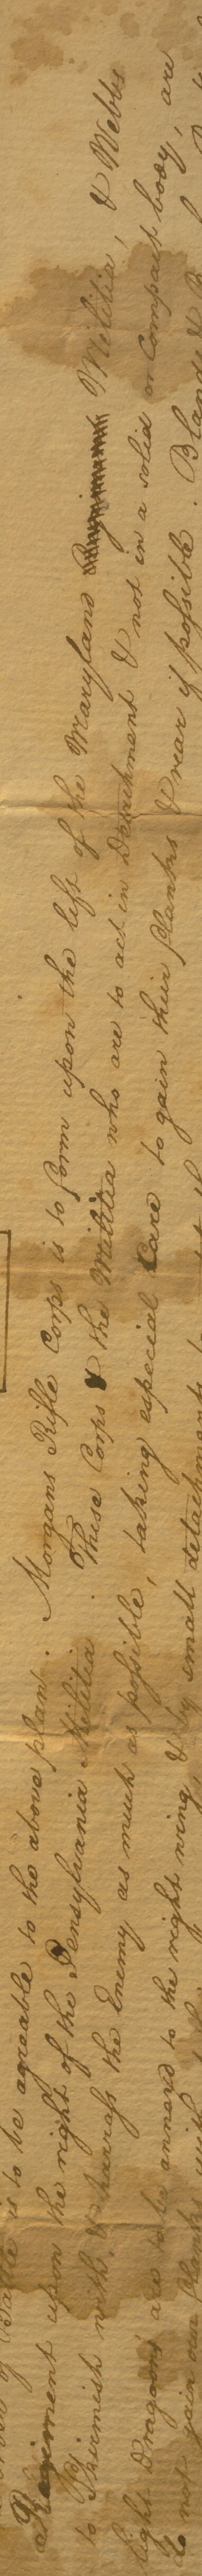Regiment upon the right of the Pensylvania Militia. These Corps & the Militia who are to act in Department & not in a solid or Compact body, are
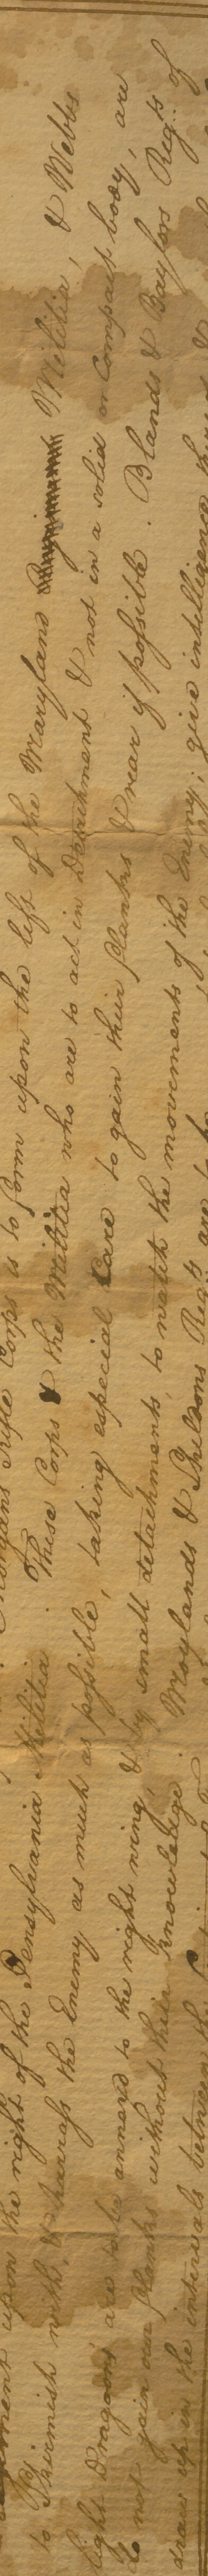to Skirmish with & harrass the Enemy as much as possible, taking especial Care to gain their flanks & rear if possible. Blands & Baylors Reg^t. of
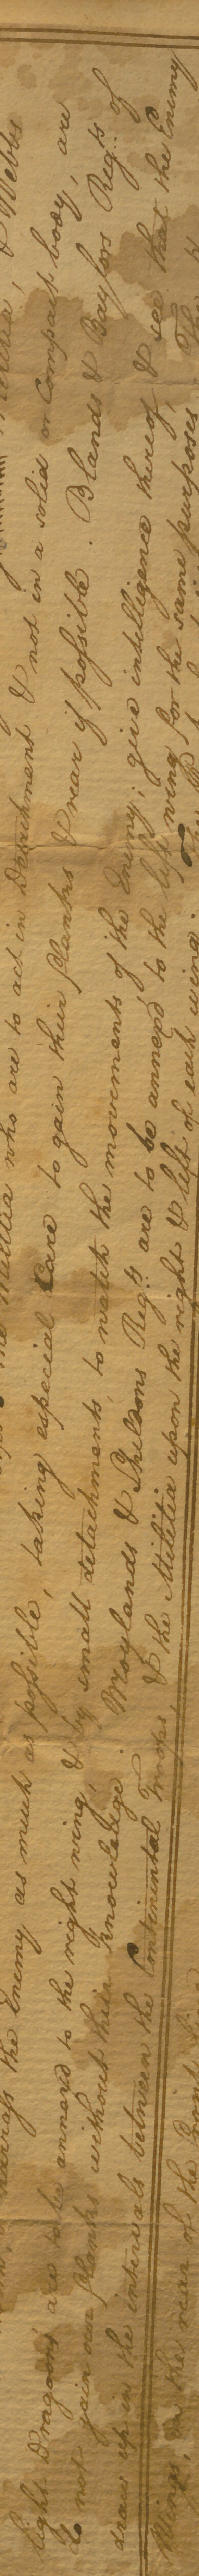light Dragoon's are to be annexd to the right wing, & by small detachments, to watch the movements of the Enemy; give intelligence thereof, & see that the Enemy
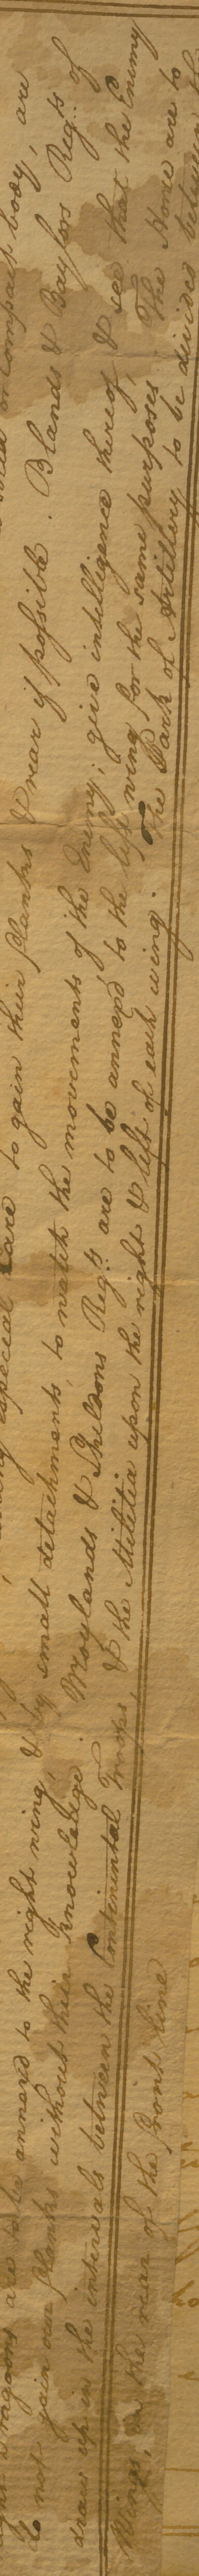do not gain our flanks without their knowledge. Marylands & Sheldons Reg^ts. are to be annex'd to the left wing for the same purposes. The Horse are to
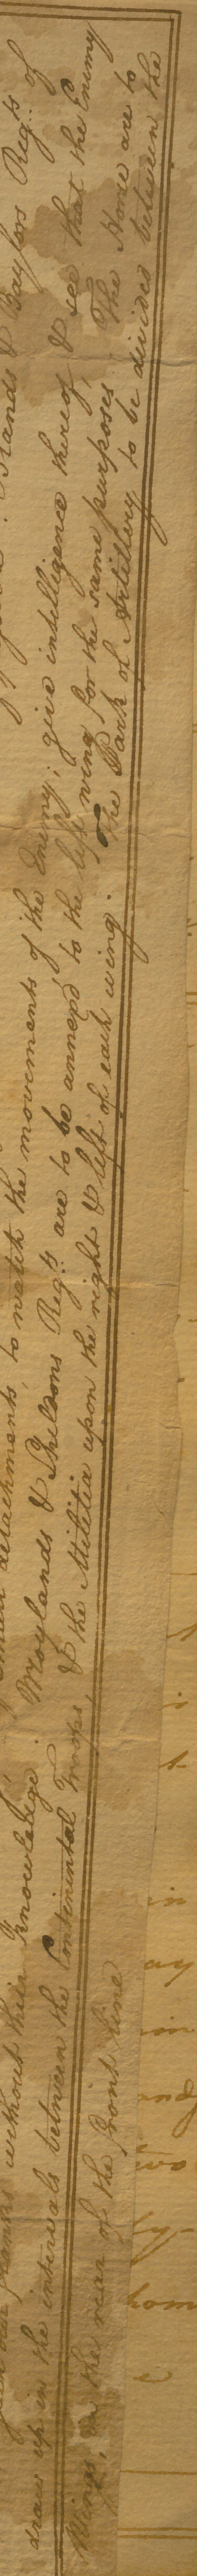draw up in the intervals between the Continental troops, & the Militia upon the right & left of each wing. The Park of Artillery to be divided between the
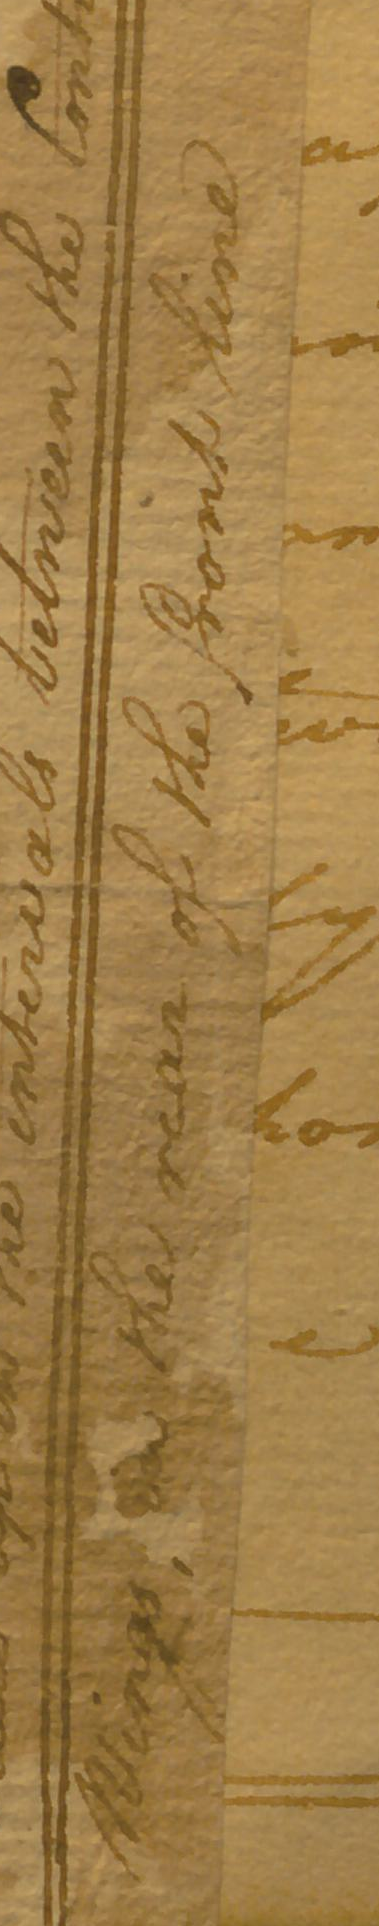Wings, in the rear of the front line.
